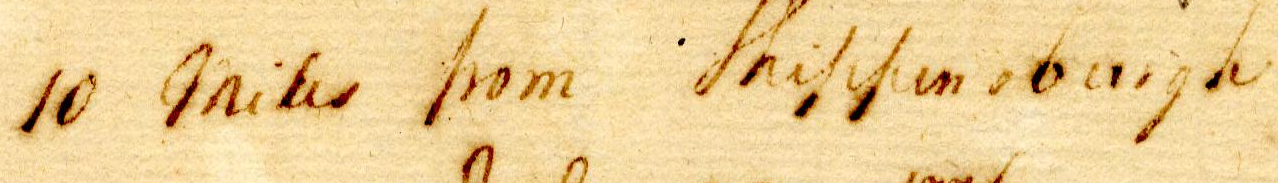10 Miles from Shippensburgh
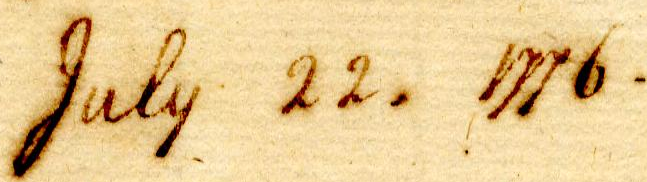July 22. 1776
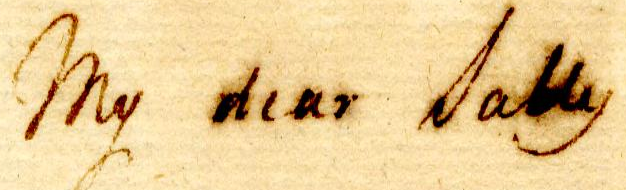My dear Sally
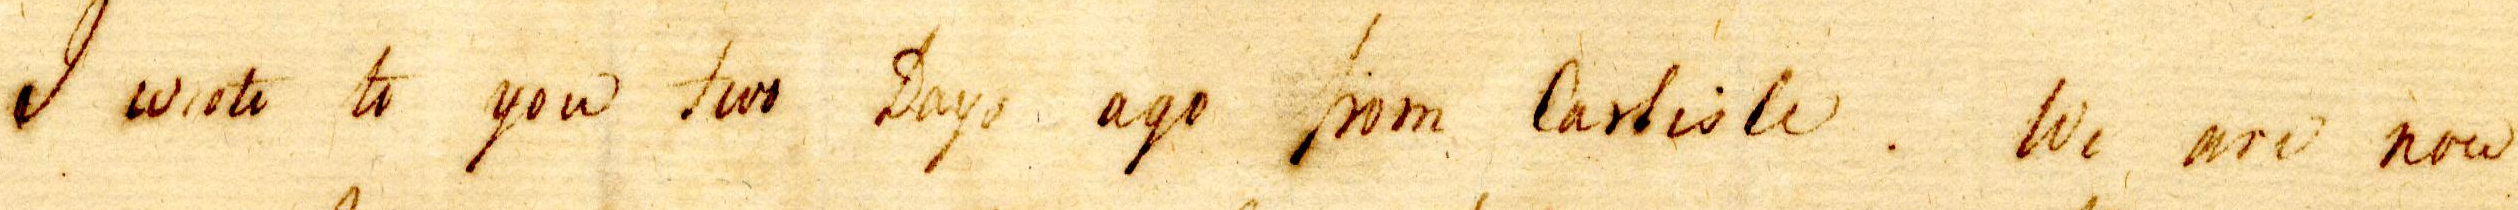I wrote to you two Days ago from Carlisle. We are now
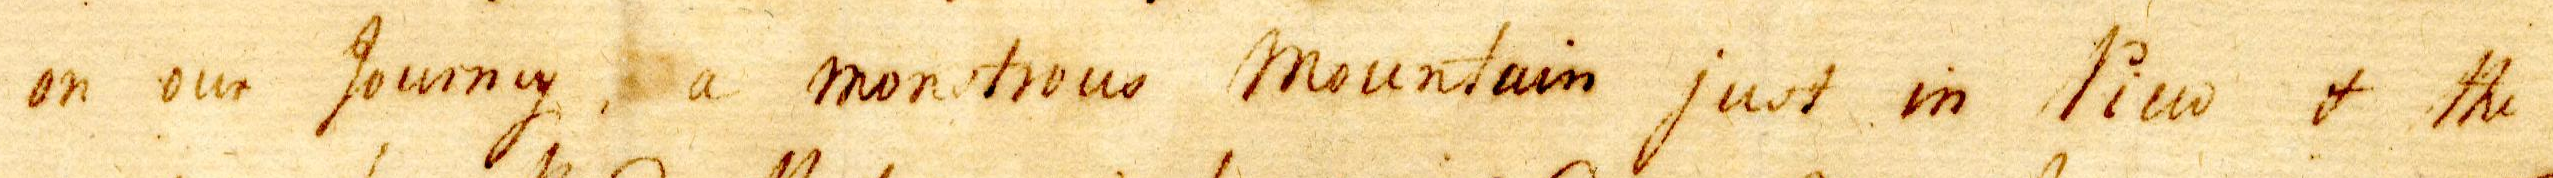on our Journey, a monstrous mountain just in View & the
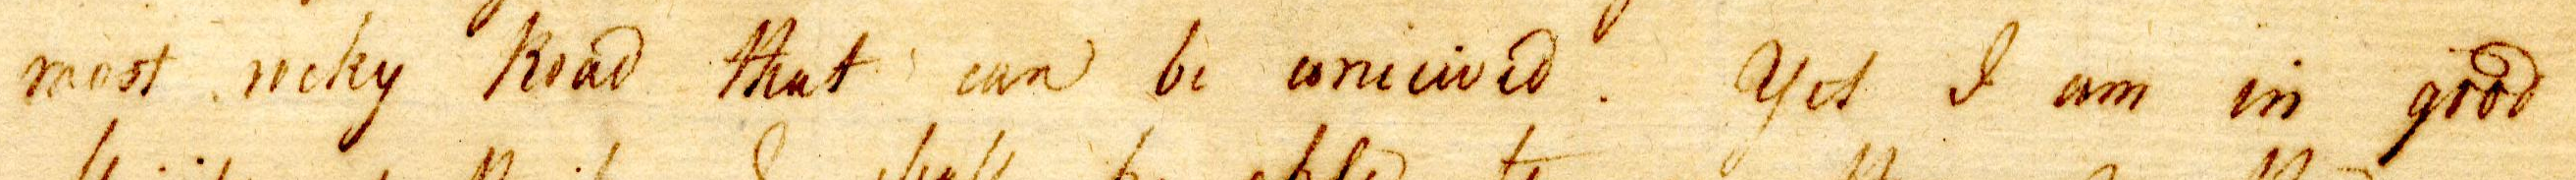most rocky Road that can be conceived. Yet I am in good
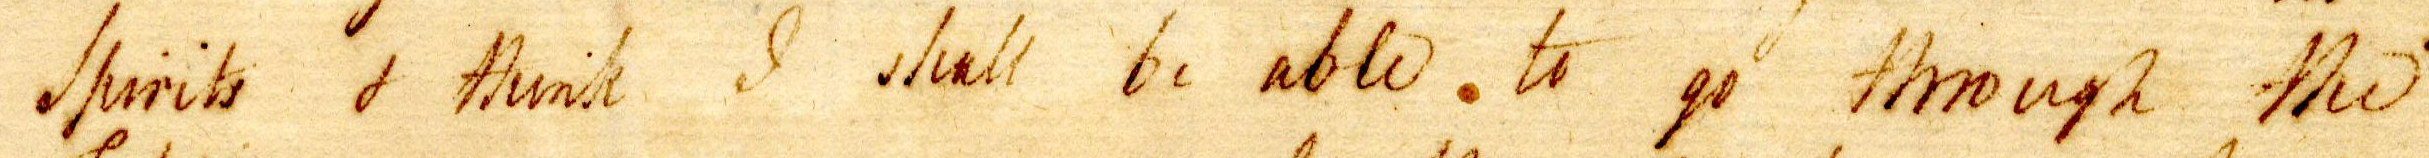Spirits & think I shall be able to go though the
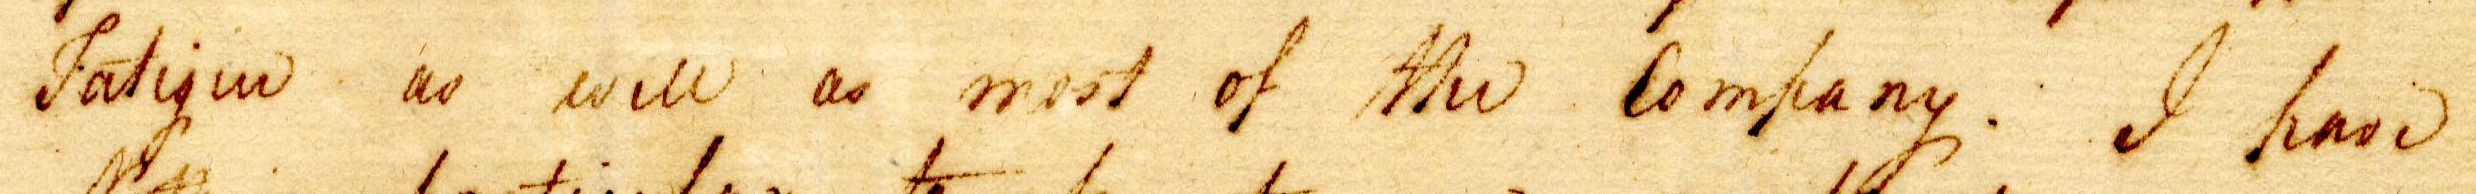Fatigue as well as most of the Company. I have
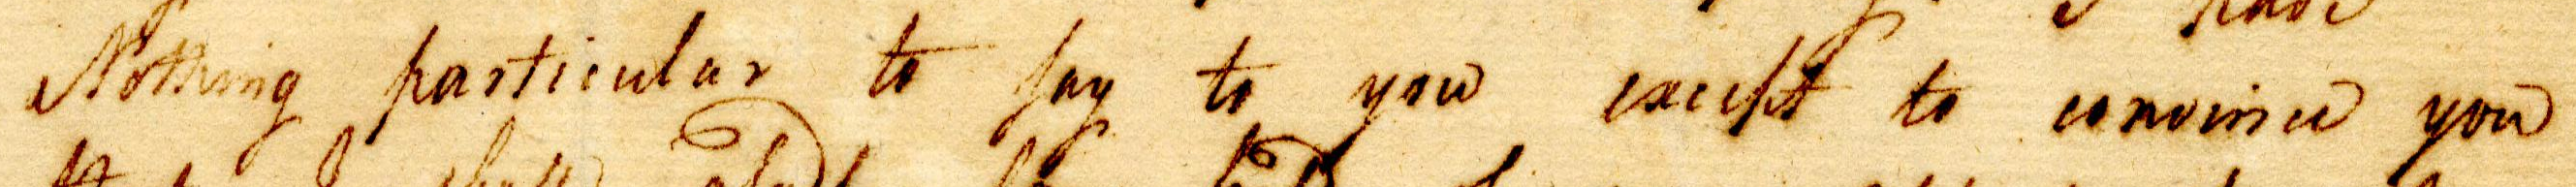Nothing particular to say to you except to convince you
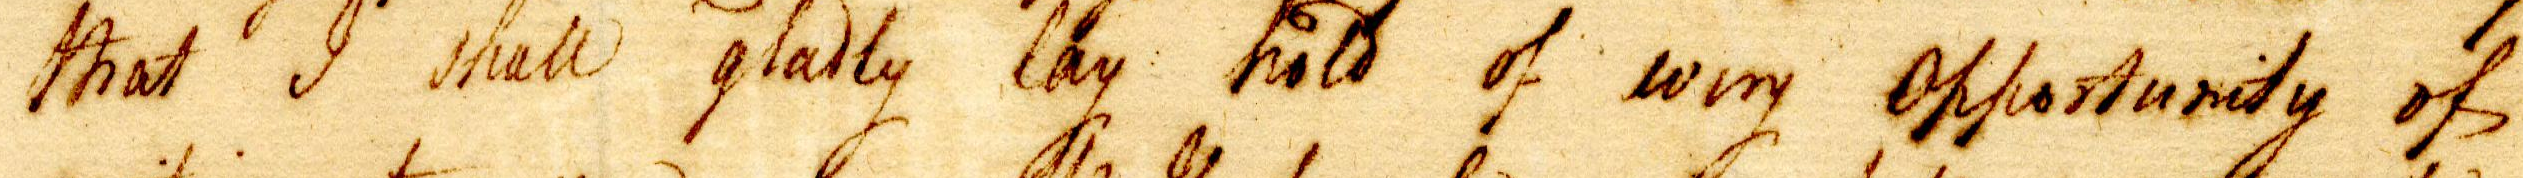that I shall gladly lay hold of every Opportunity of
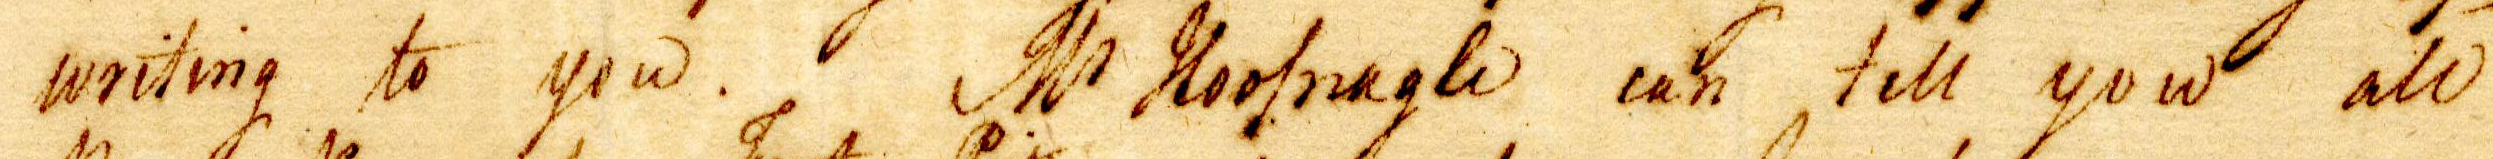writing to you. M^r Hoofnagle can tell you all
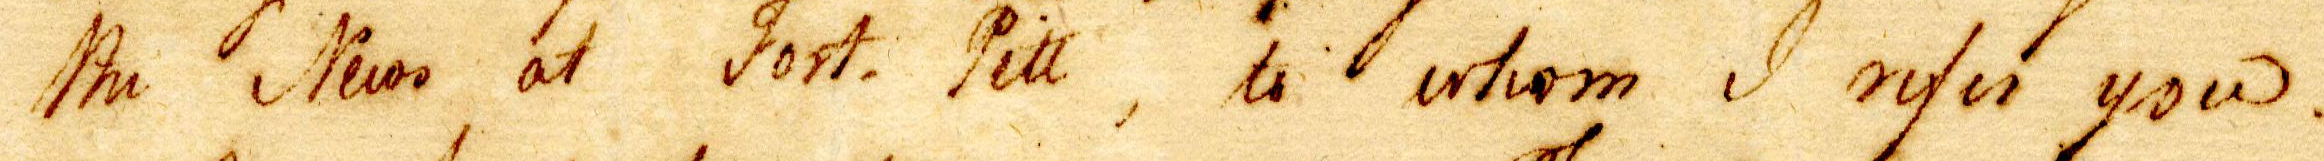the News at Fort. Pitt, to whom I refer you.
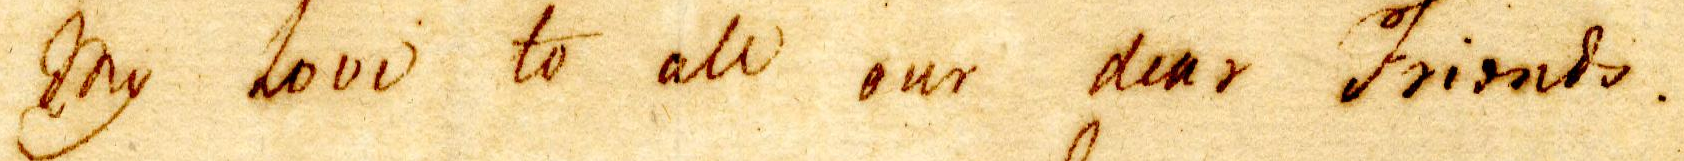My Love to all our dear Friends.
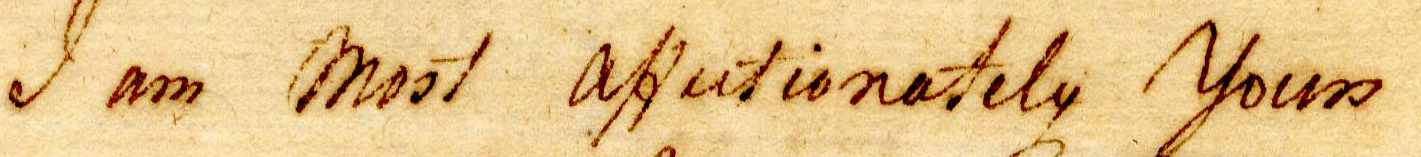I am Most affectionately Yours
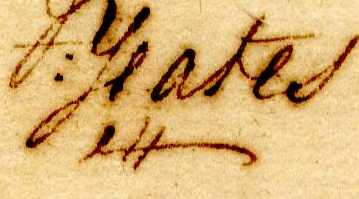J: Yeates
